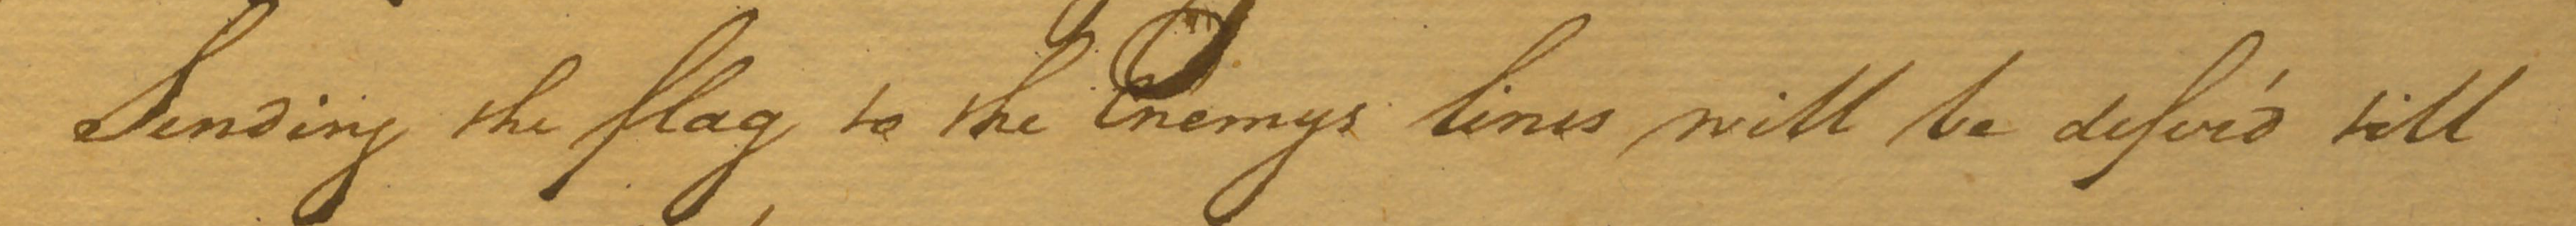Sending the flag to the Enemy lines will be defer'd till
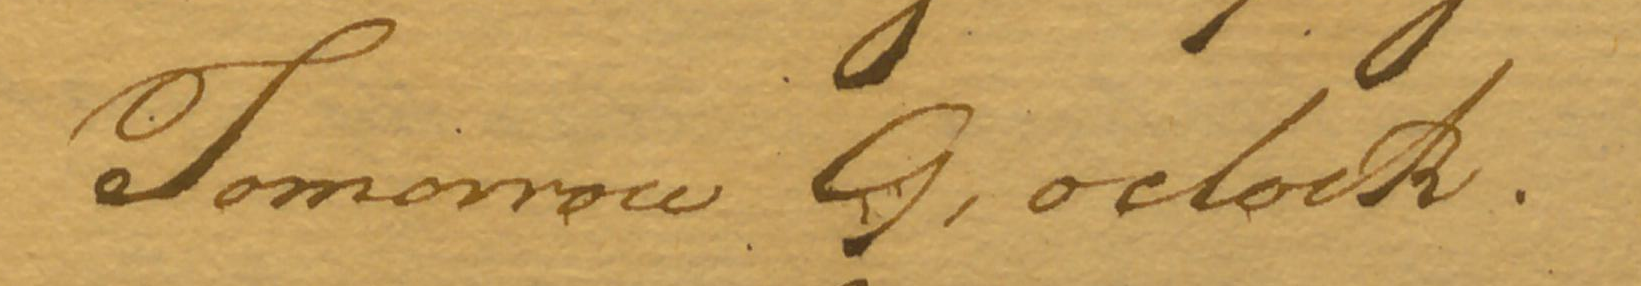Tomorrow 9, oclock.
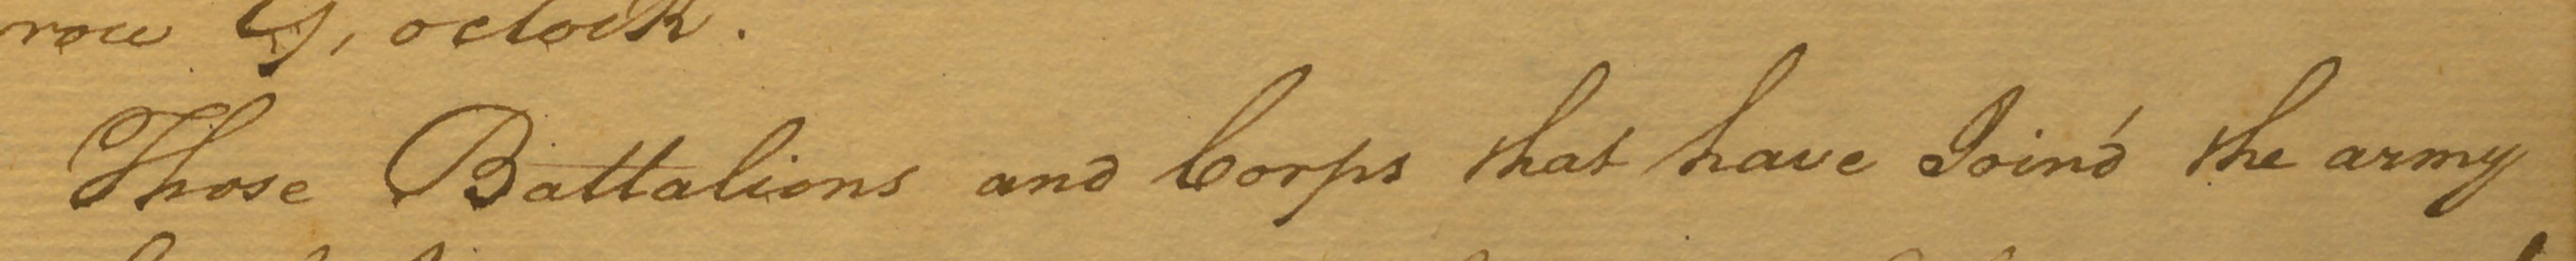Those Battalions and Corps that have Join'd the army
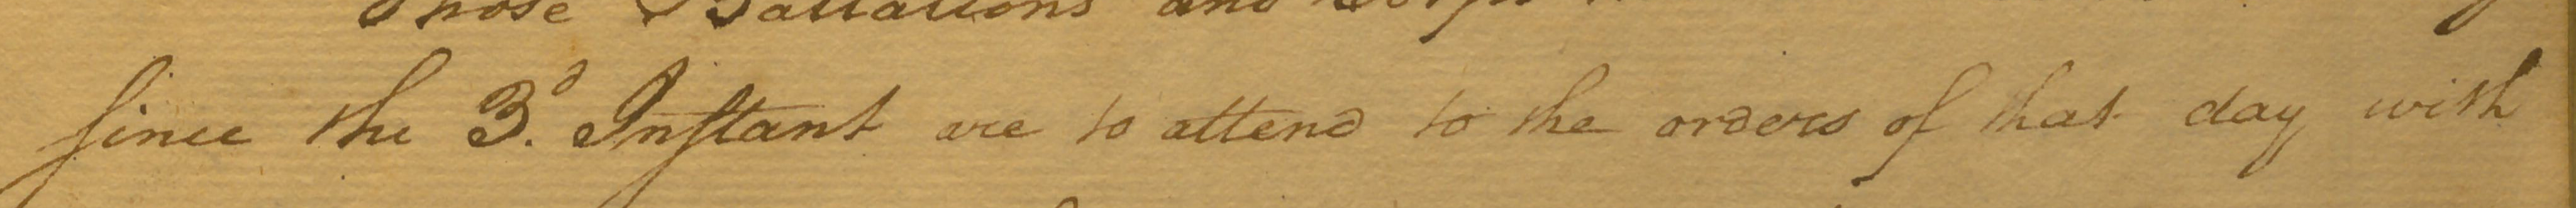since the 3^d. Instant are to attend to the orders of that day with
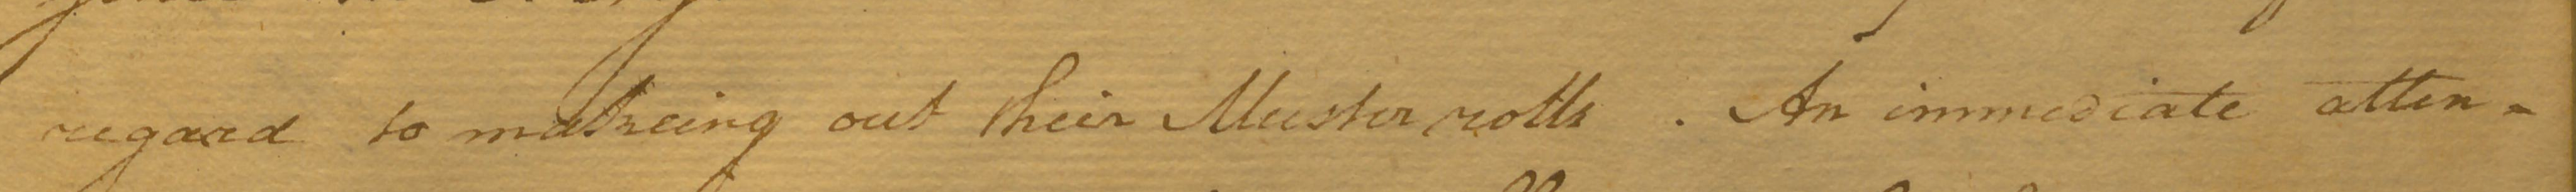regard to makeing out their Muster rools. An immediate atten-
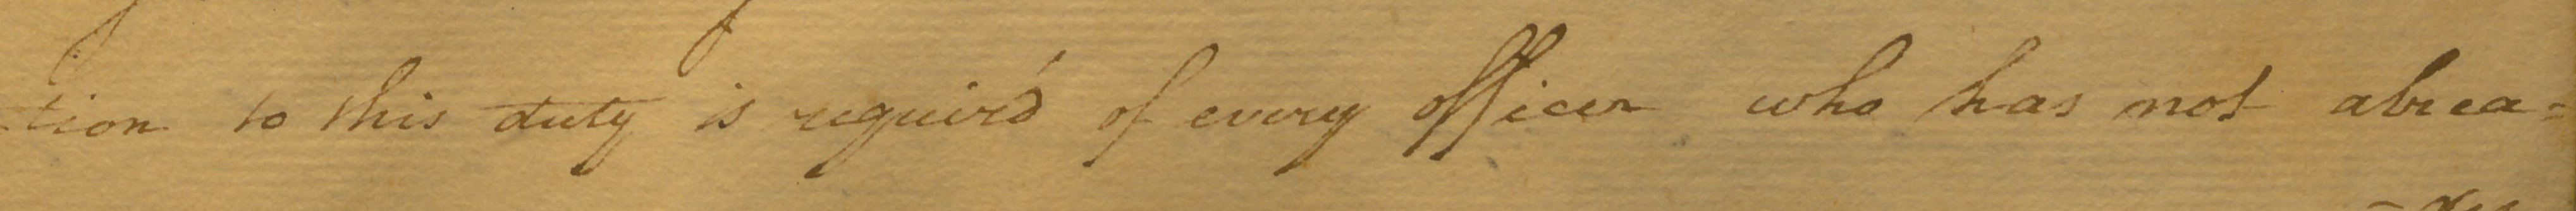-tion to this duty is requir'd of every officer who has not alrea-
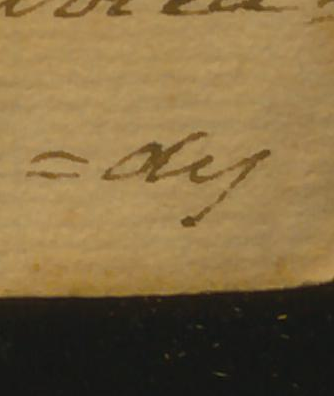-dy
